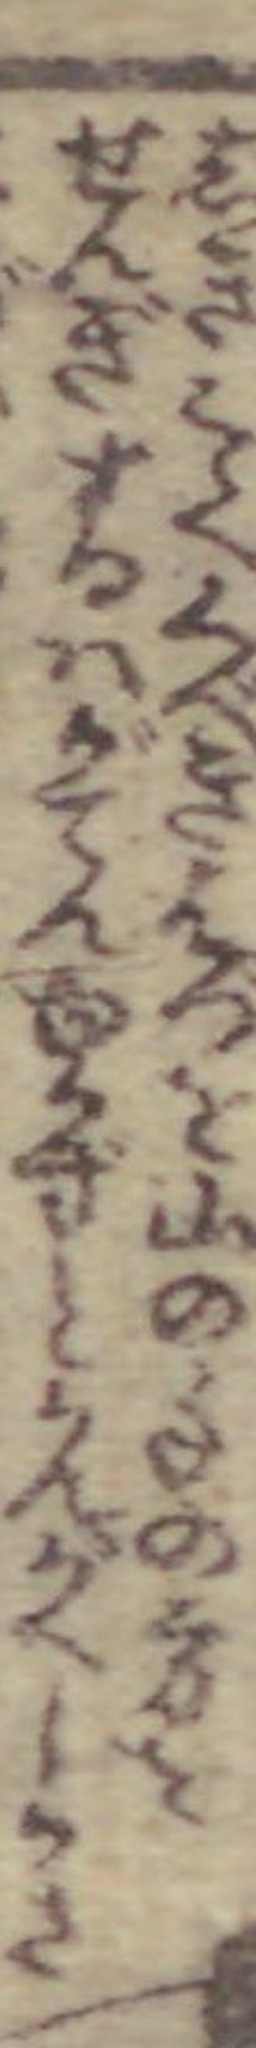せんぎするはがてんゆかずとかんがへしかさ
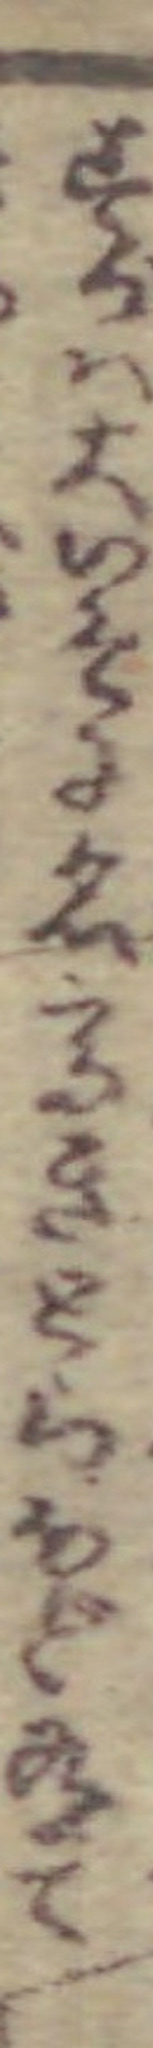すがは大いそに名高きとらほど有て
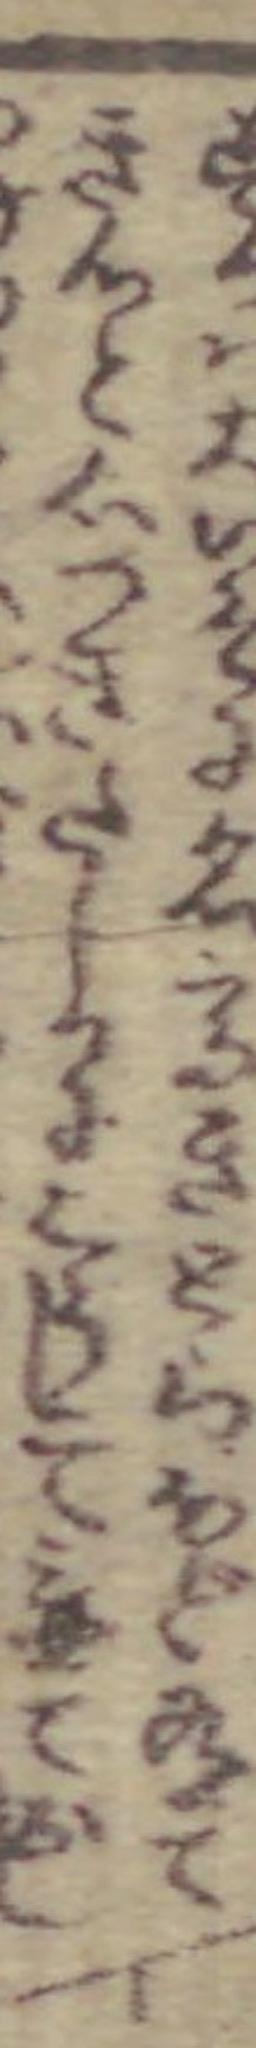きつと心つきたしかにこうして置ておし
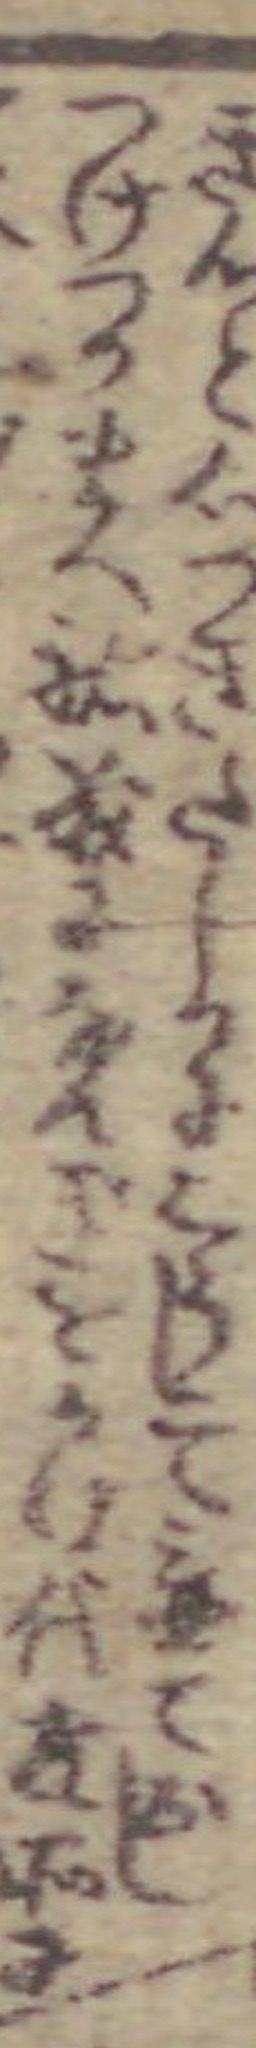つけつかまへ祐成になんぎをかけ代官所に
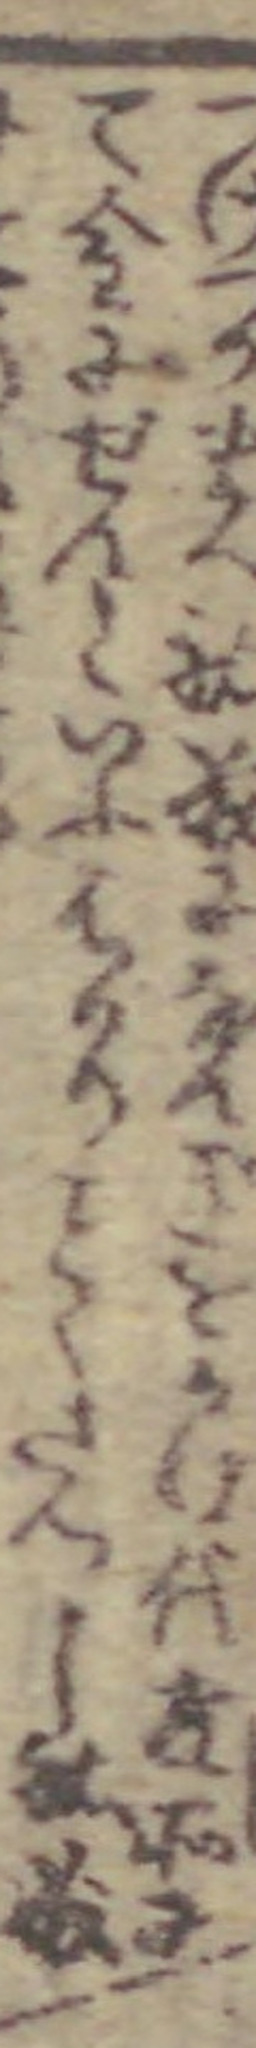て金にせんといふはかりことゝさつし祐成
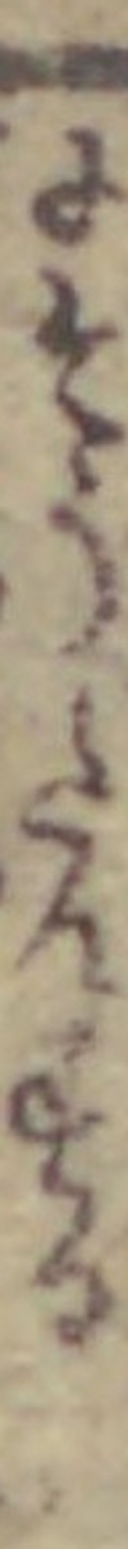にそうたんする
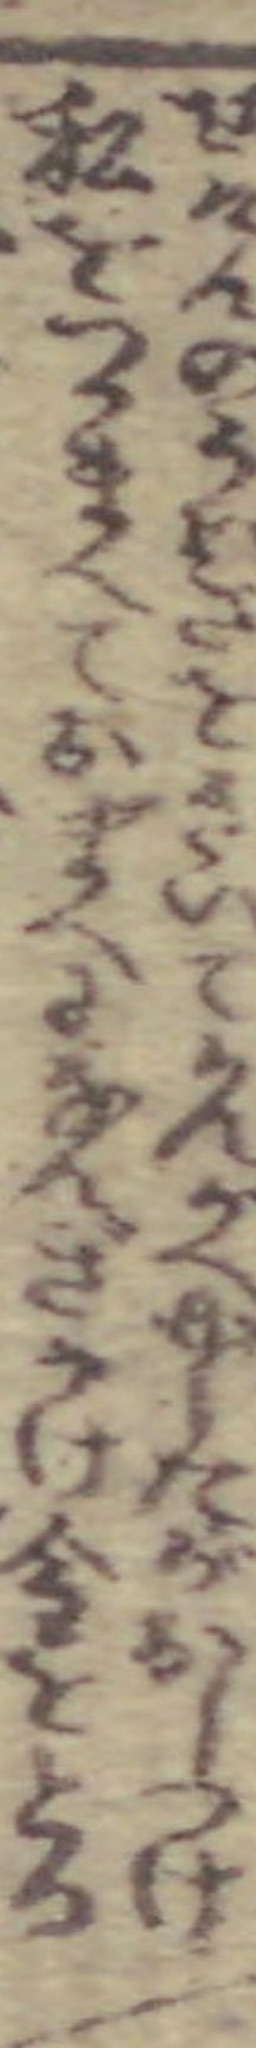私をつかまへておまへになんぎかけ金をとる
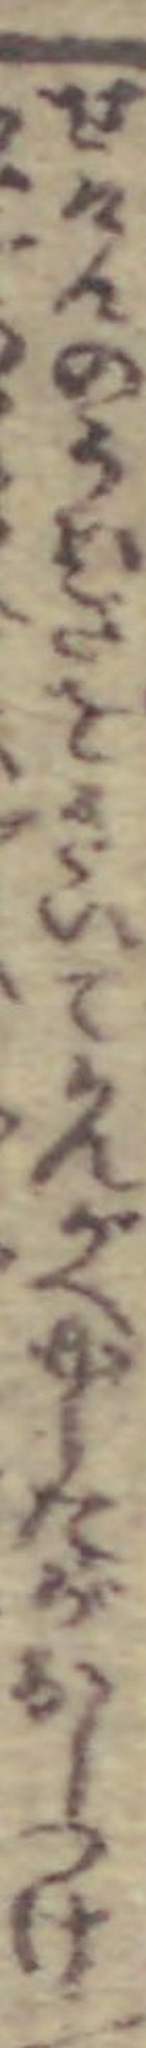せけんのうはさをきいてかんがへやしたがおしつけ
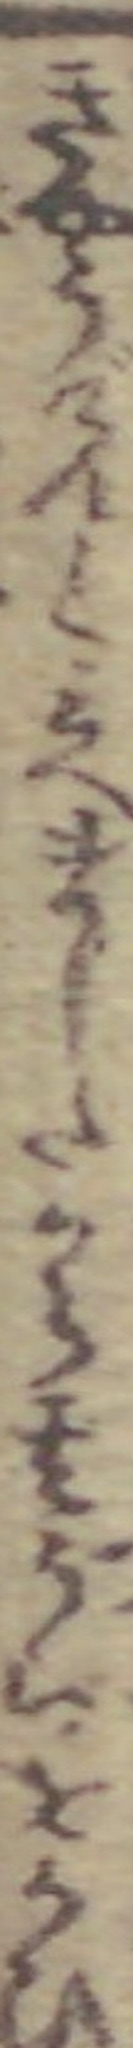きやうげんとみへましたから其うらをかひ
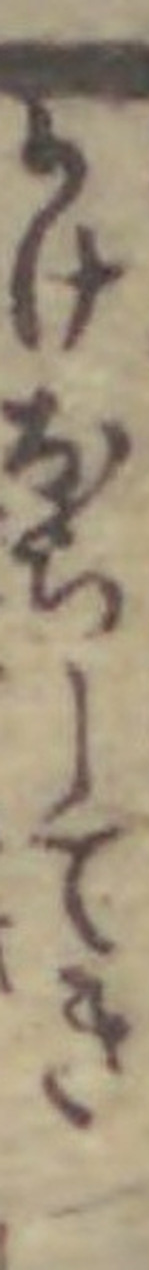かけおちしてき
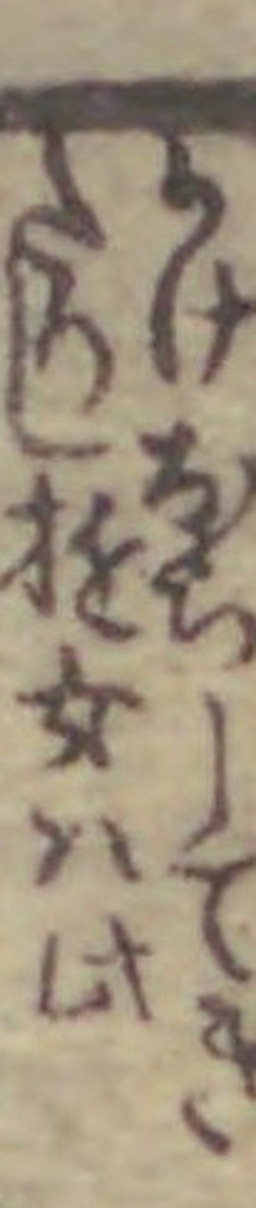たりし遊女は此
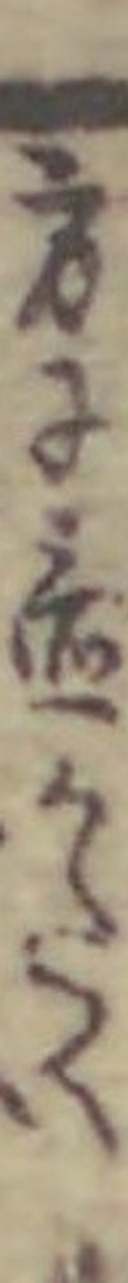方に置かたく
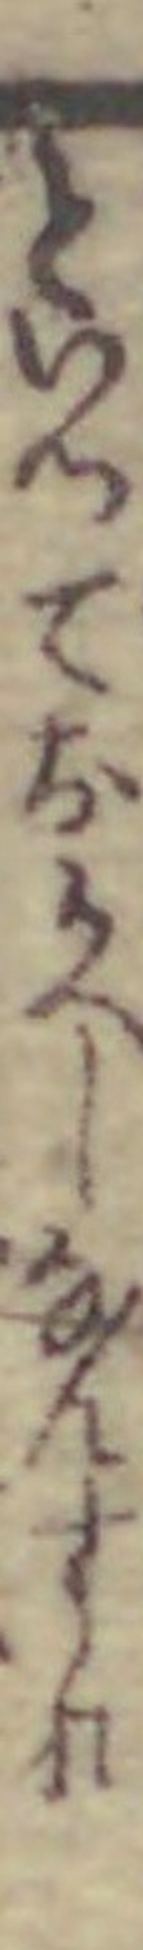といつておかへしなんすれ
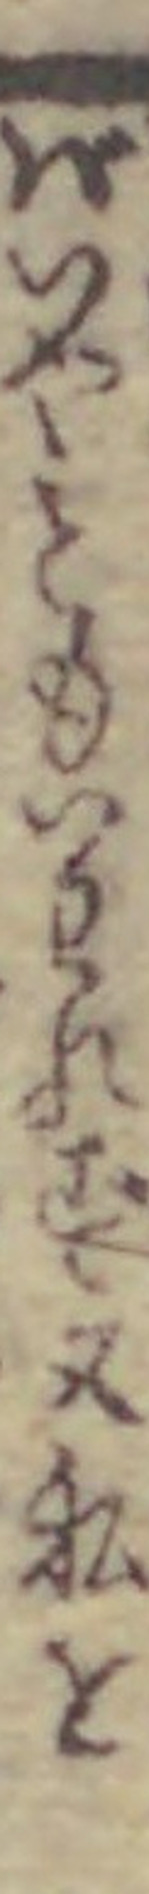ばいやともいわれず又私を
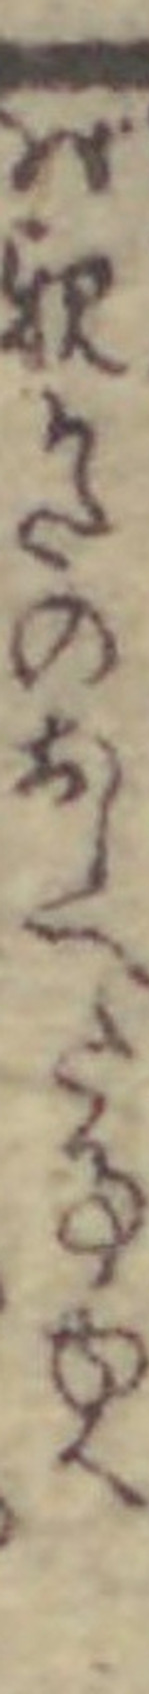ば親かたのおしへた事ゆへ
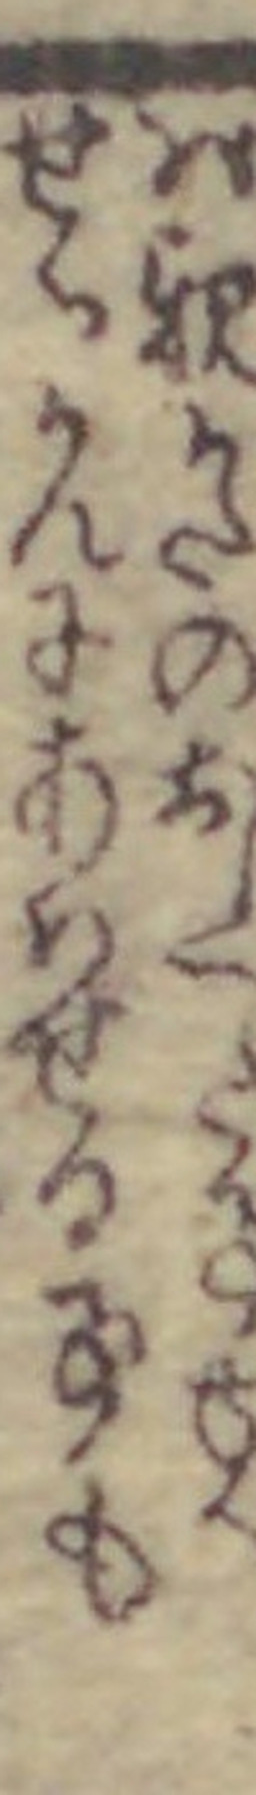せつかんにあわせる事も
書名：間似合嘘言曽我 3巻
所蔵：国立国会図書館 National Diet Library, JAPAN
